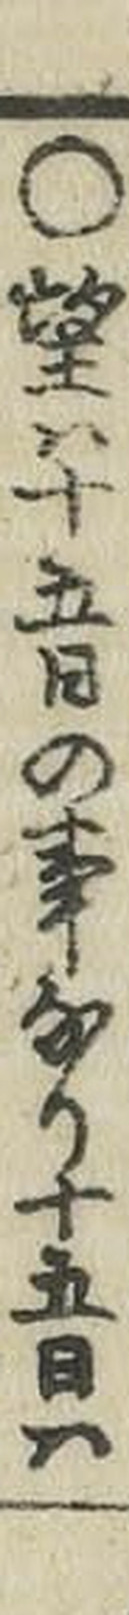○望は十五日の事なり十五日は
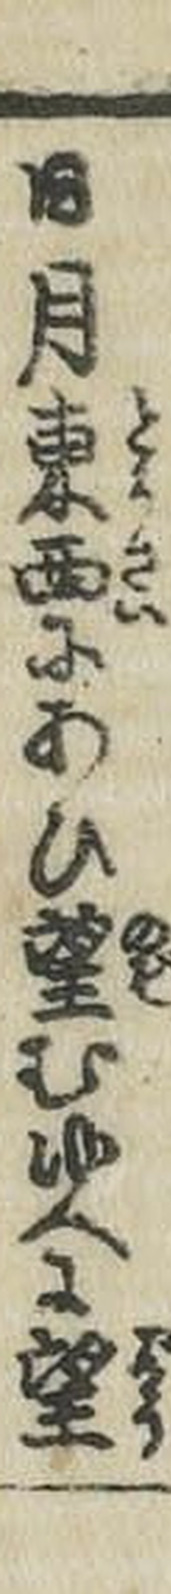日月東西にあひ望むゆへに望
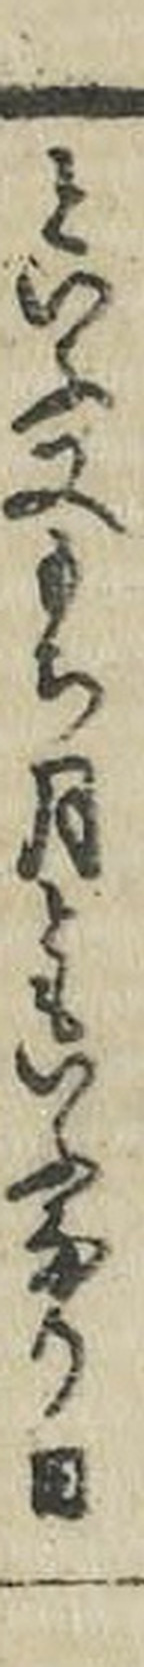といふ又もち月ともいふなり日

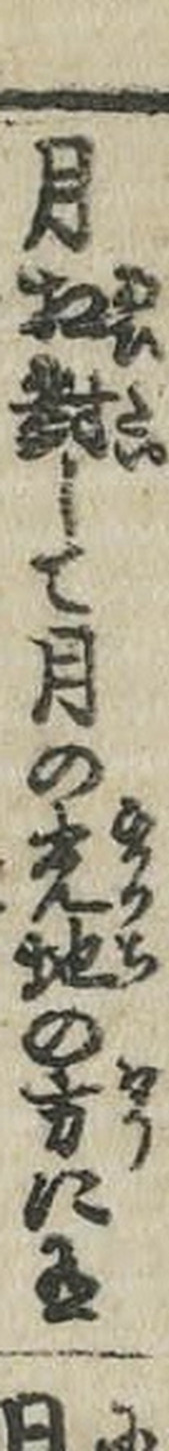月相対して月の光地の方に有
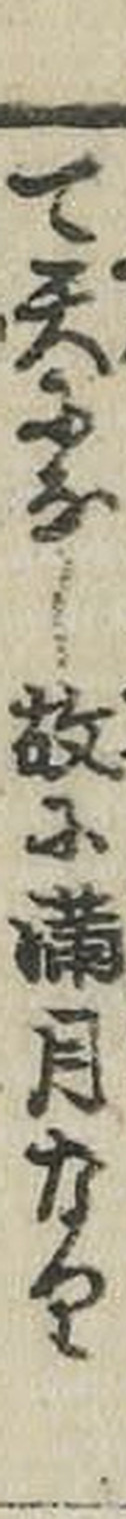て天になし故に満月なり
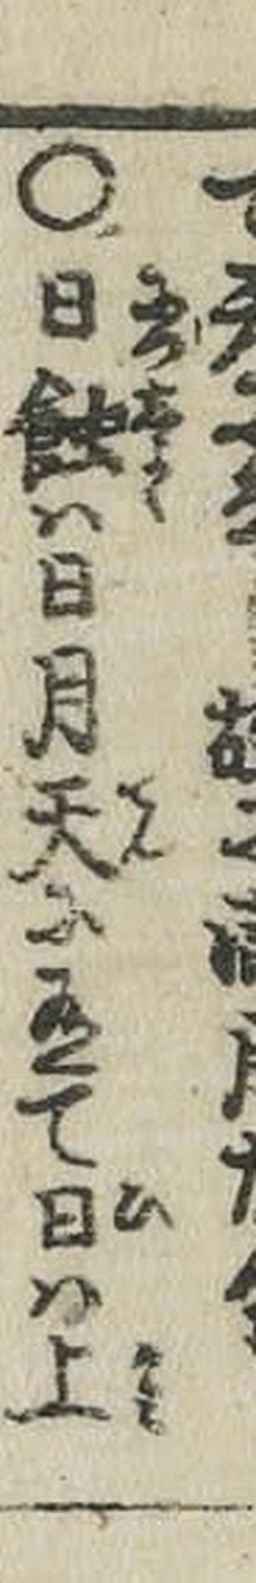○日蝕は日月天に有て日は上
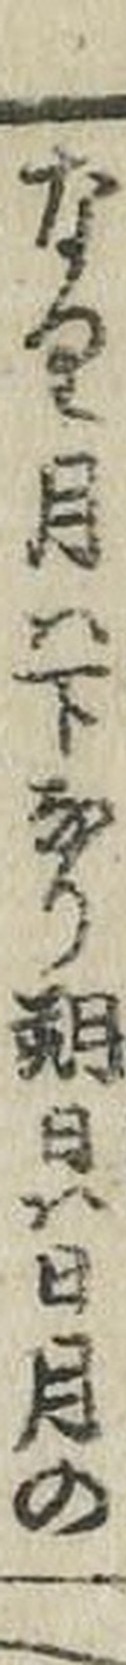なり月は下なり朔日は日月の
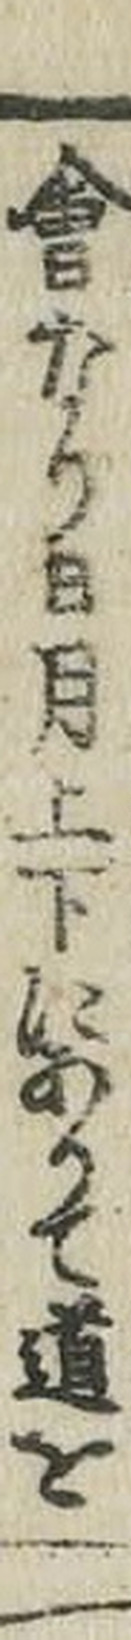会なり日月上下にありて道を
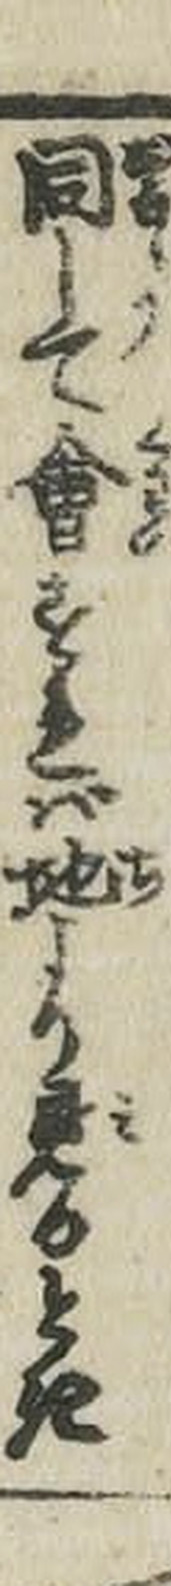同して会すれば地より見るとき
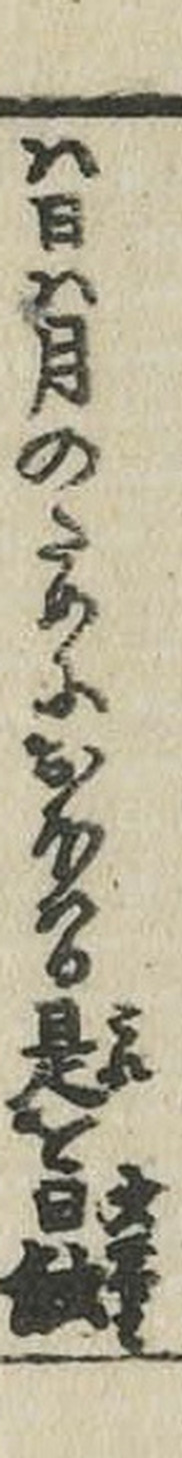は日は月のためにおほはる是を日蝕
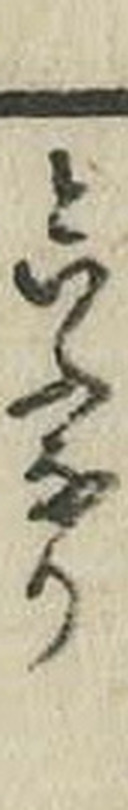といふなり
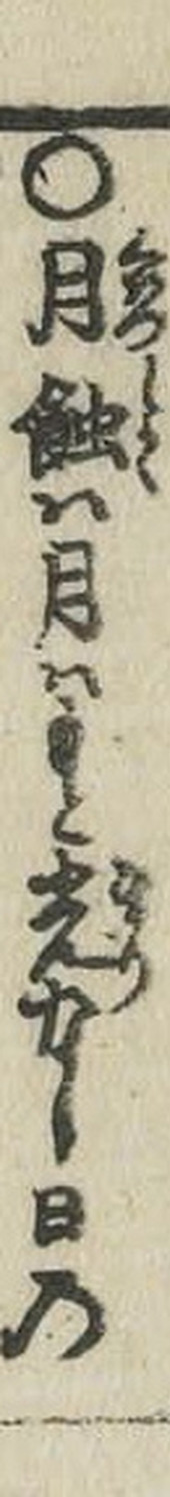○月蝕は月はもと光なし日の
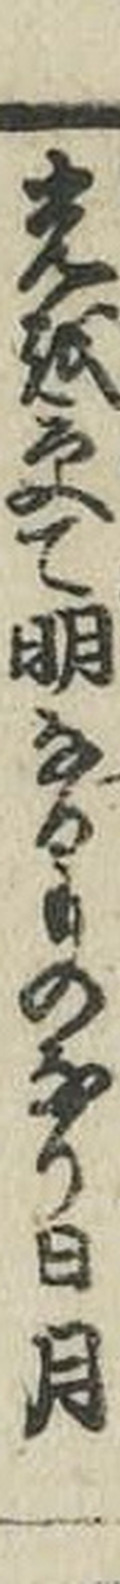光を受て明なるものなり日月
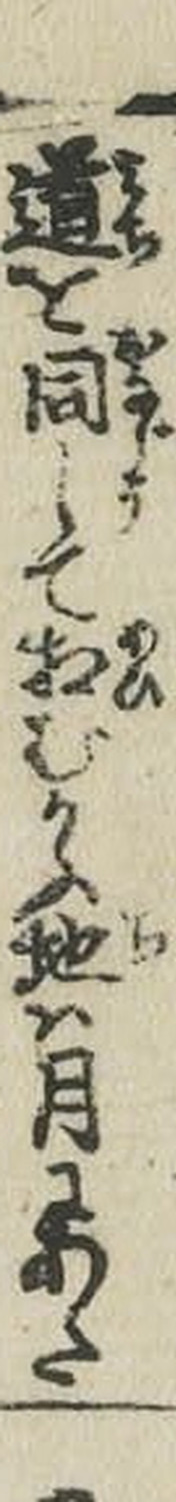道を同して相むかふ地は月にあた
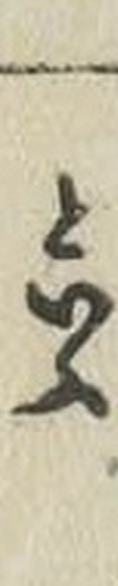といふ
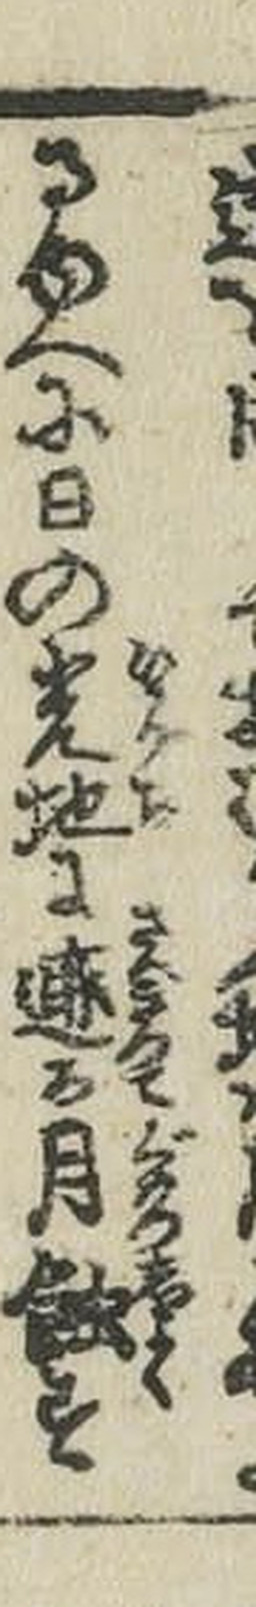るゆへに日の光地に遮る月蝕す
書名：増補頭書訓蒙図彙大成 10巻 2:巻之1-3
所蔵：東京学芸大学教育コンテンツアーカイブ
